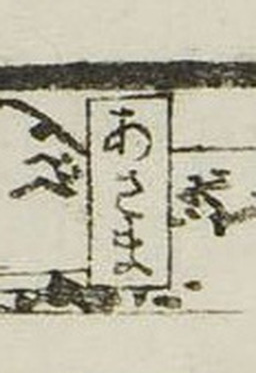あさま

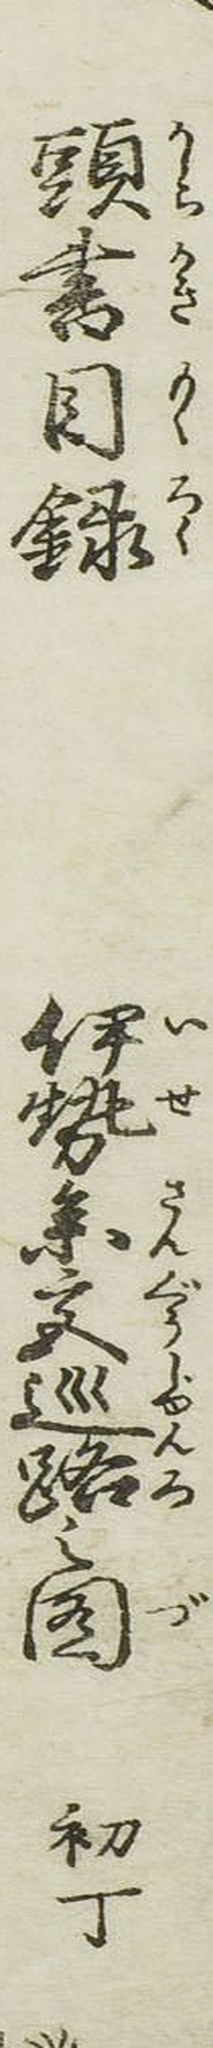頭書目録伊勢参宮巡路之図初丁
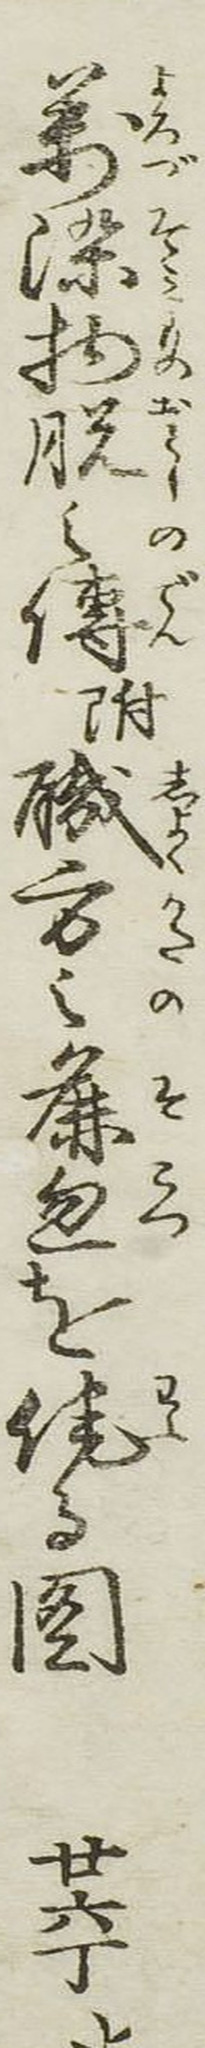万染物脱之伝付職方之麤忽を侘る図廿六丁
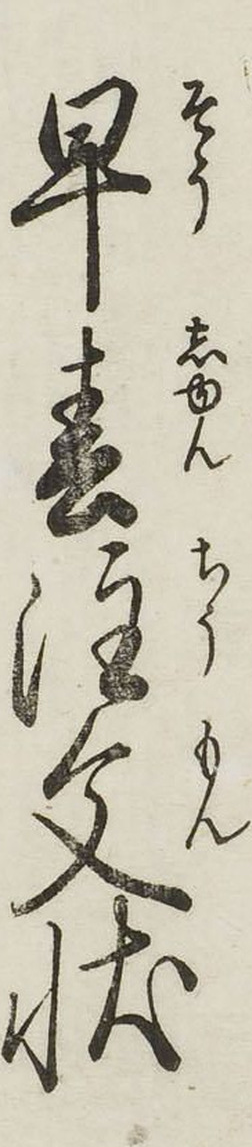早春注文状
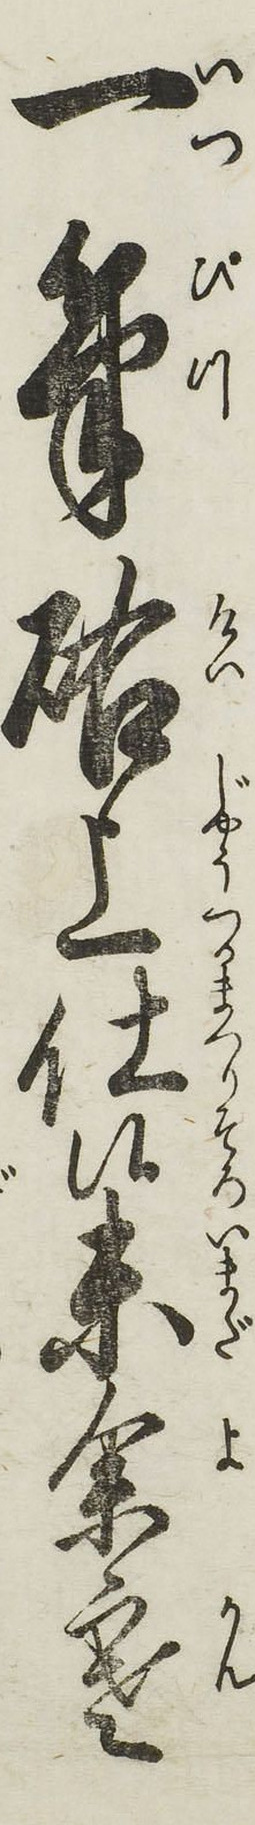一筆啓上仕候未余寒
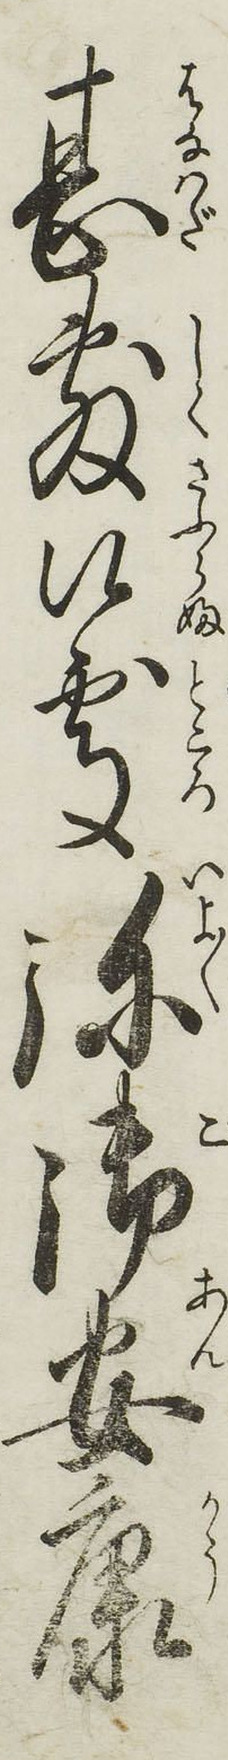甚敷候処弥御安康
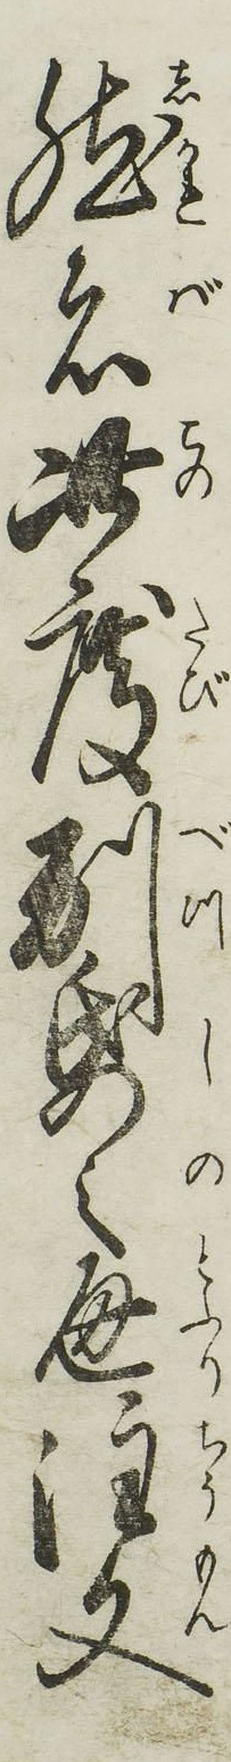然者此度別紙之通注文

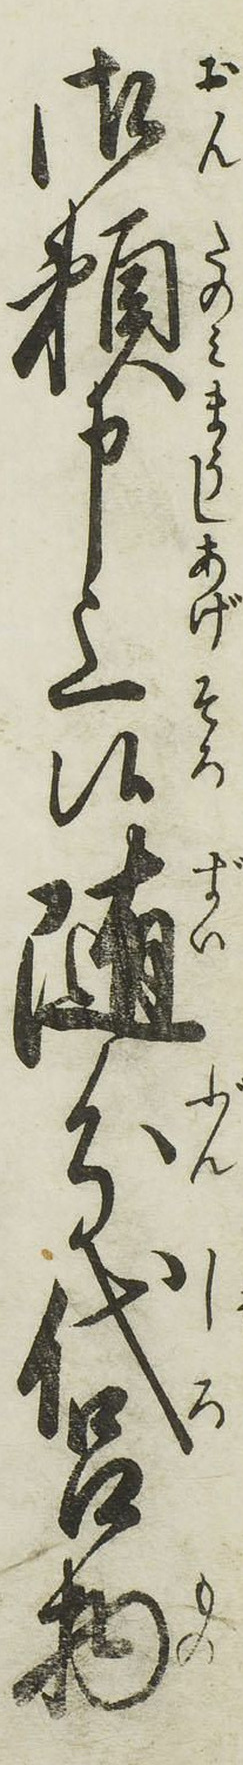御頼申上候随分代呂物
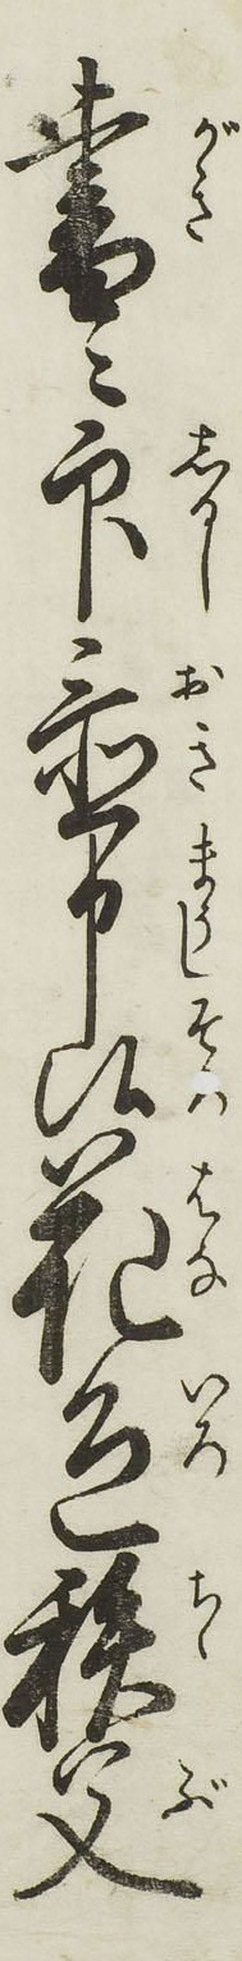書印置申候花色秩父
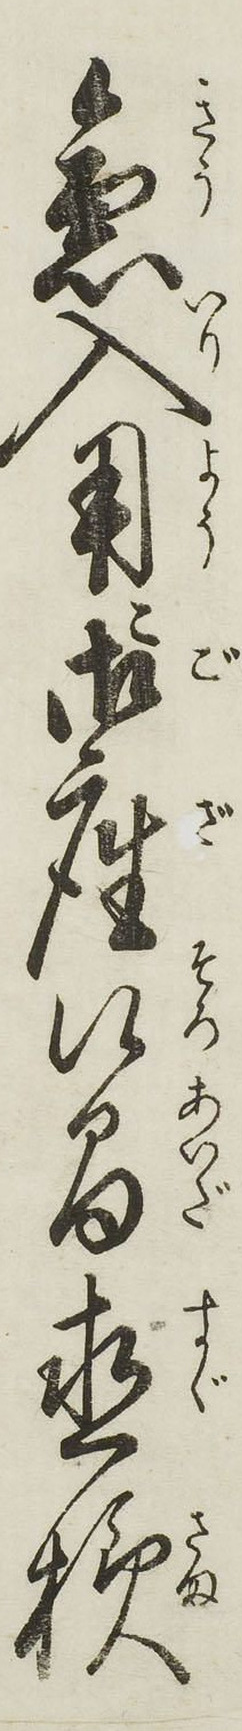急入用御座候間直様
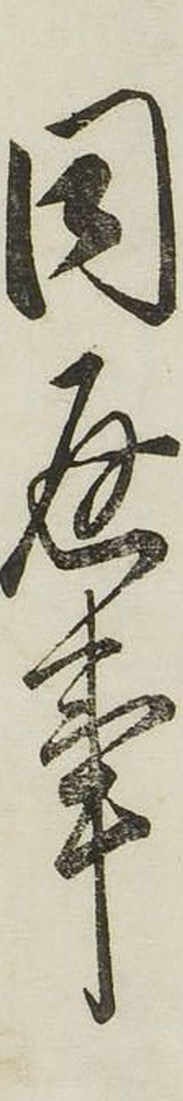同返事

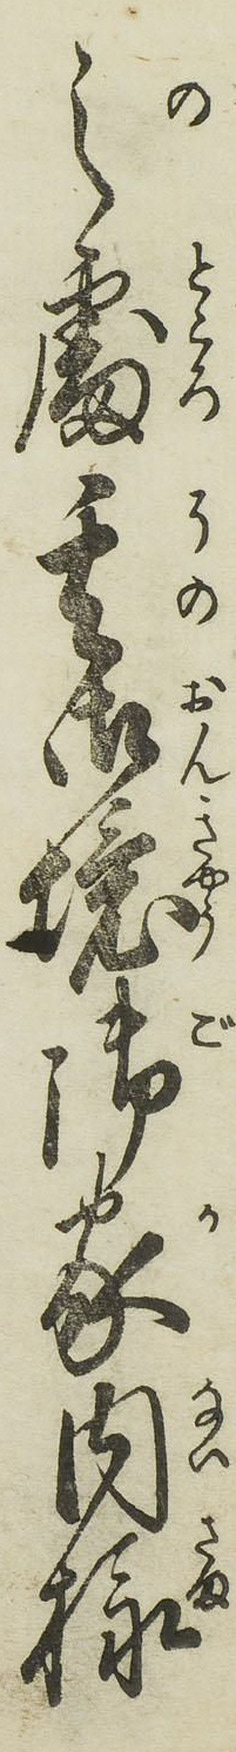之処其御境御家内様
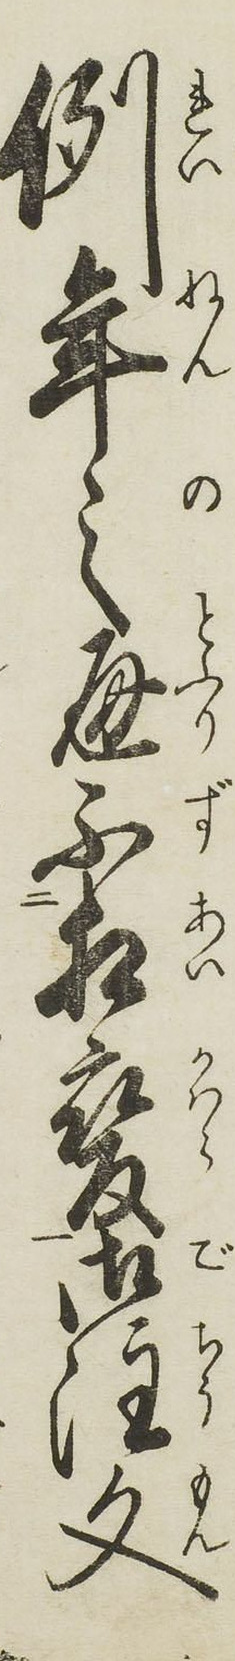例年之通不相変御注文
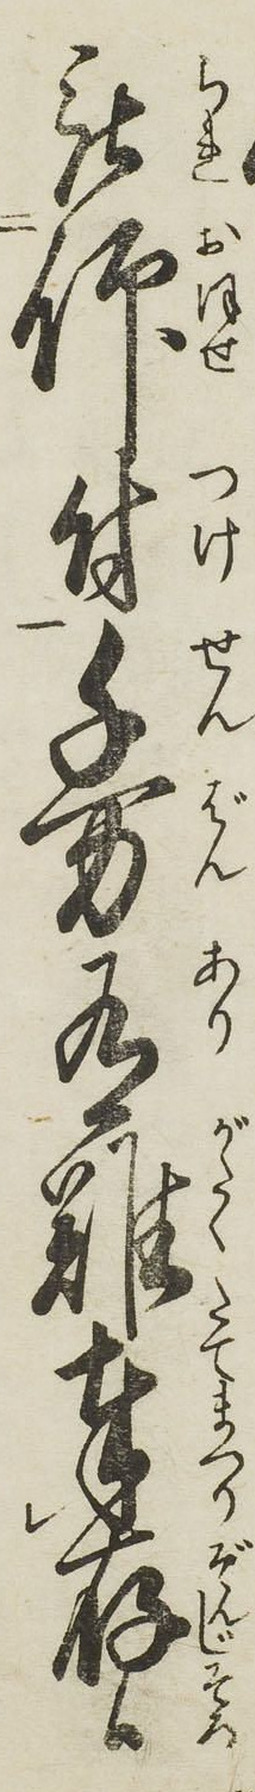被仰付千万有難奉存候

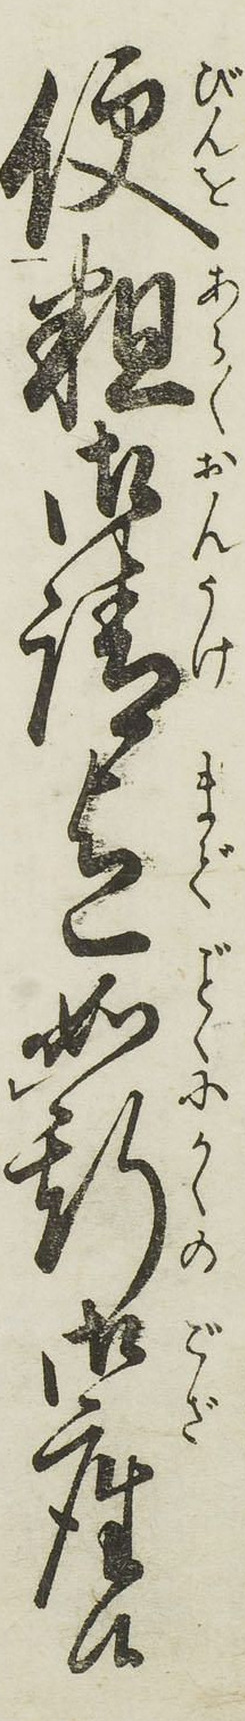便粗御請迄如斯御座候
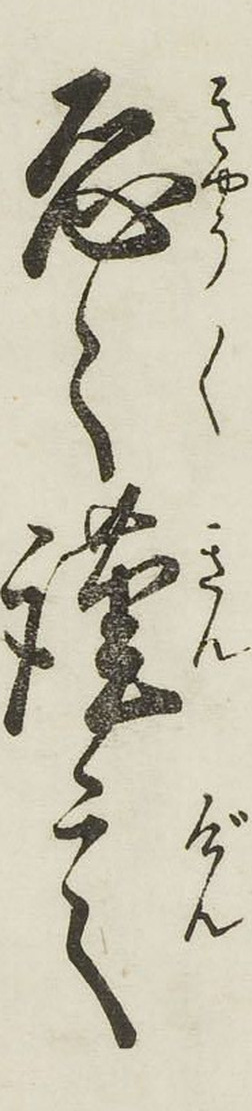恐々謹言
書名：商人書翰便覧
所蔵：東京学芸大学教育コンテンツアーカイブ
